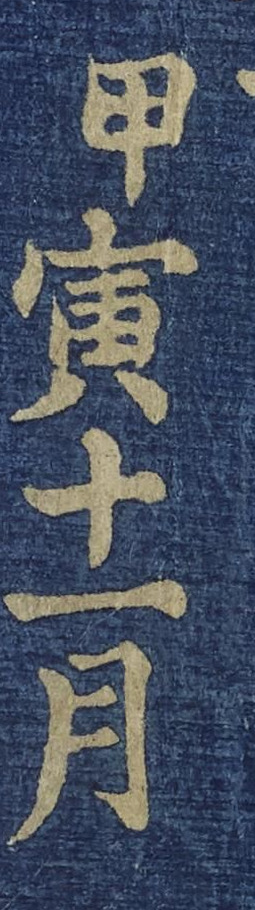甲寅十一月
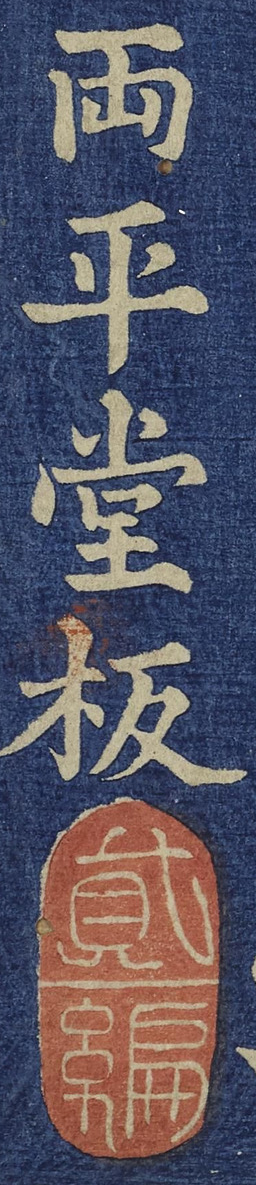両平堂板弐編

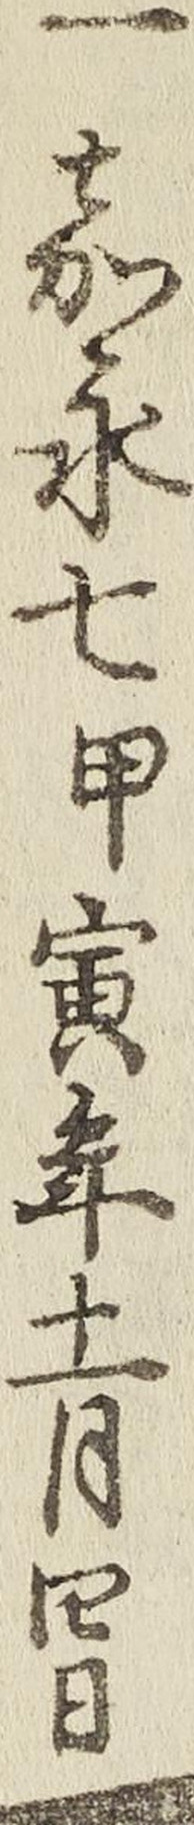一嘉永七甲寅年十一月四日

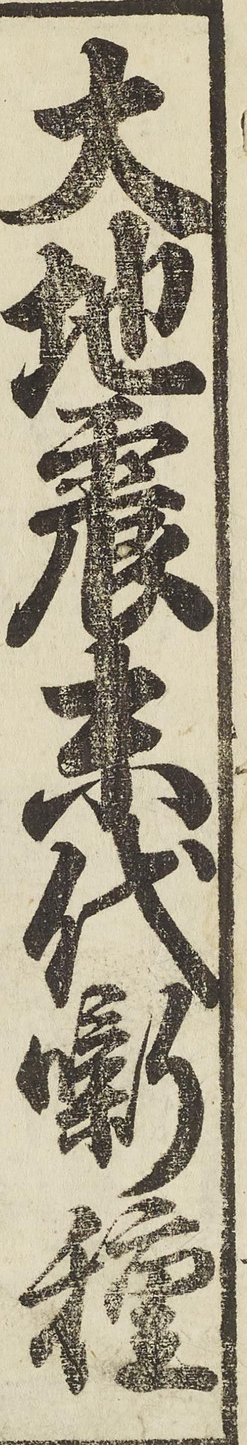大地震末代噺種
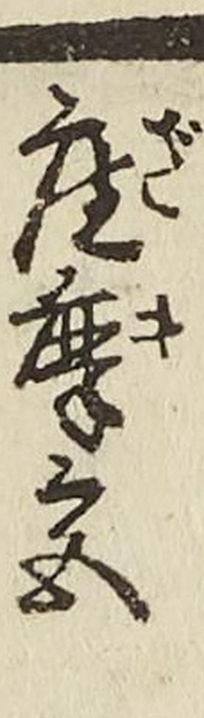座摩宮
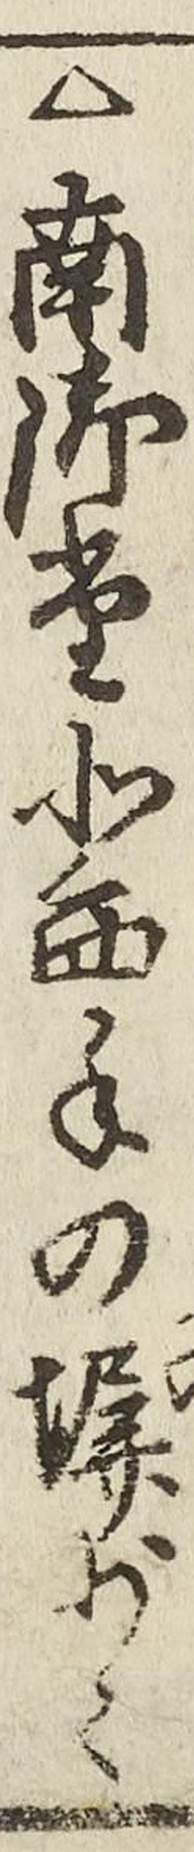△南御堂北西手の塀少々
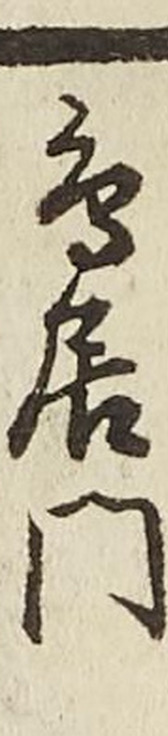鳥居門
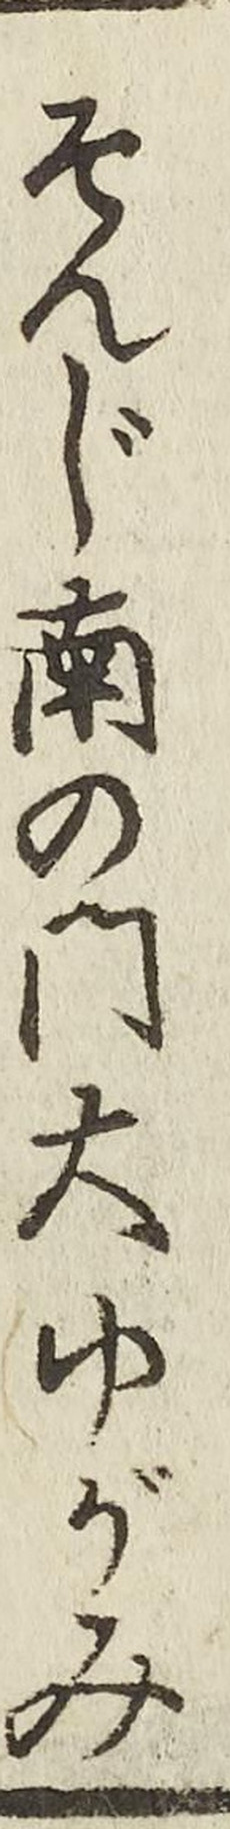そんじ南の門大ゆがみ
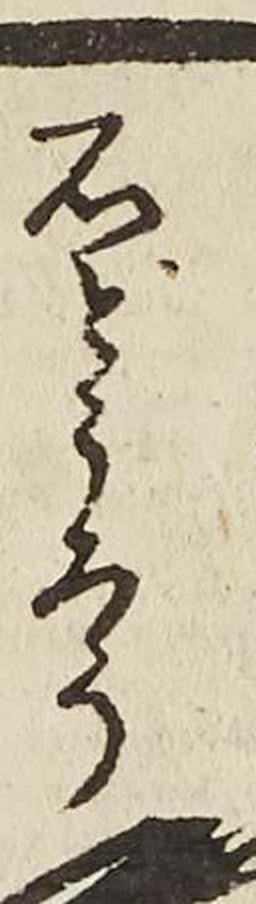石とうろう
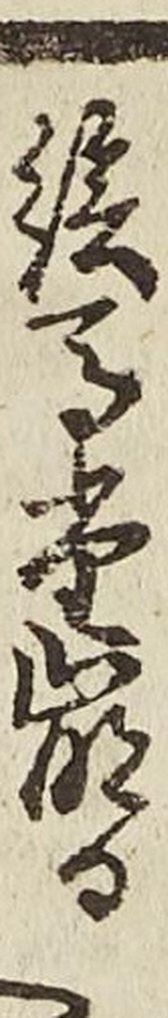絵馬堂崩る
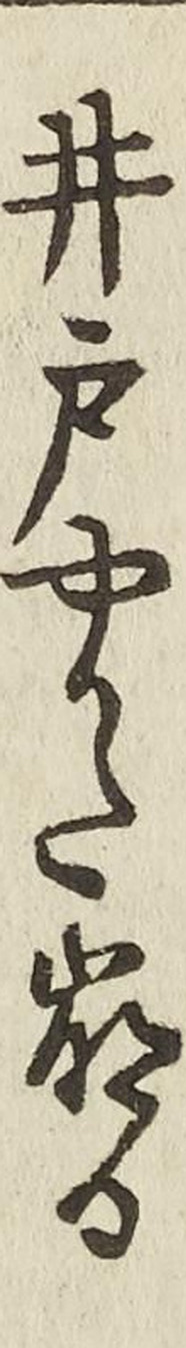井戸やかた崩る
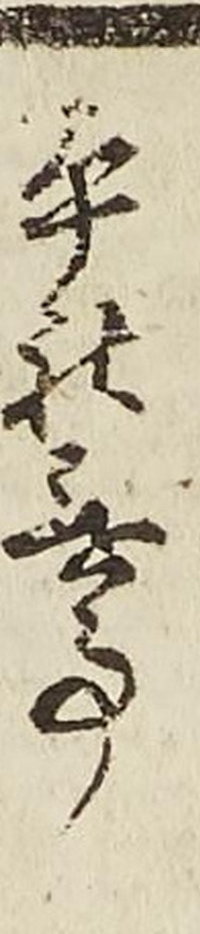平社無事
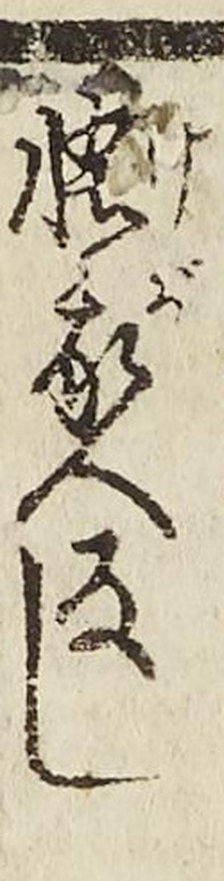怪我人なし
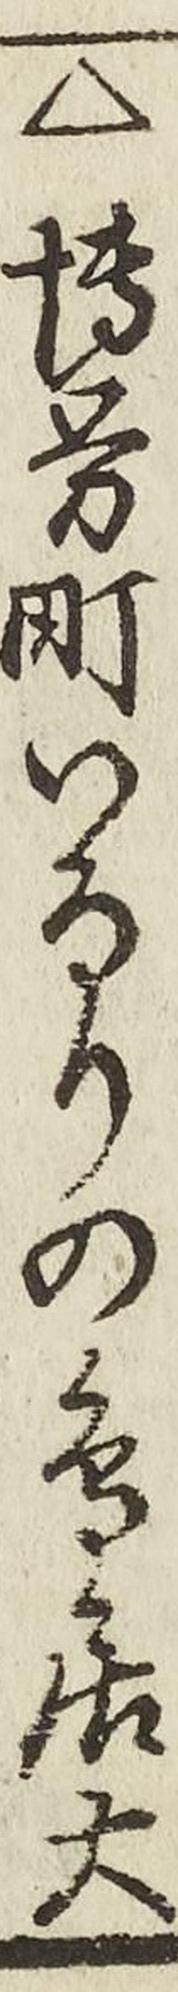△博労町いなりの鳥居大
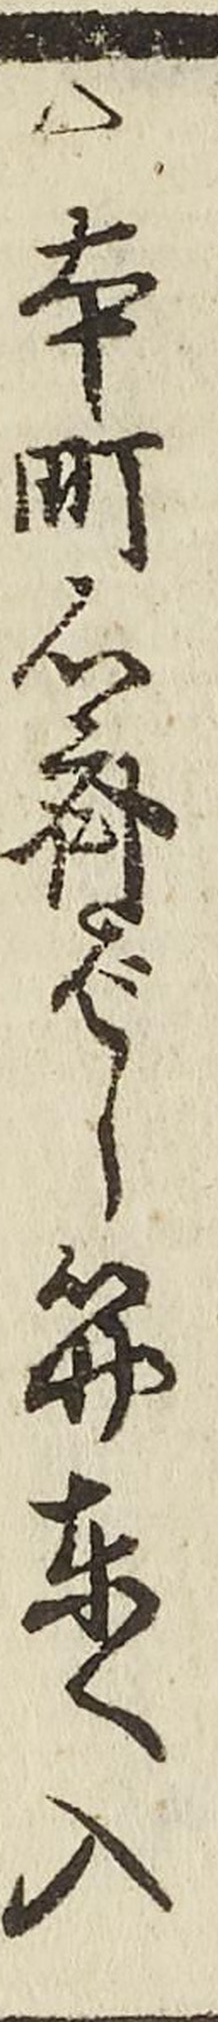△本町心斎ばし筋東へ入
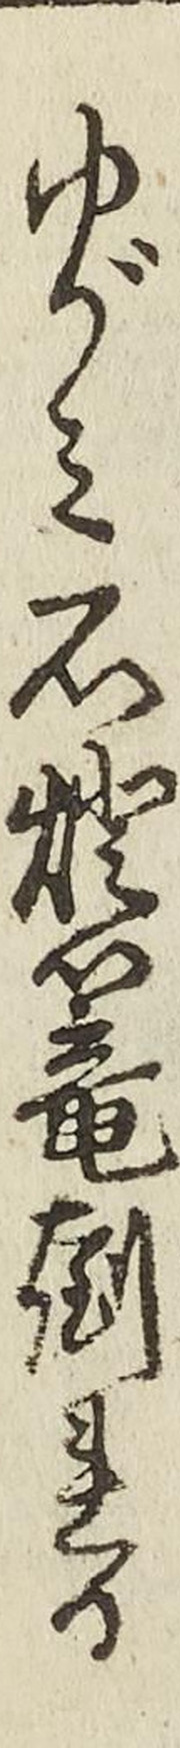ゆがみ石燈篭倒れる
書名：地震津浪末代噺の種　全
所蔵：東京大学地震研究所図書室 Earthquake Research Institute Library, The University of Tokyo, JAPAN
